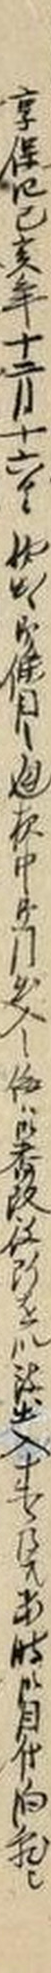享保四己亥年十二月十六日被仰出候御条目之通夜中御門出入之儀は御番改役断を以致出入来候得共当時御目付泊願被
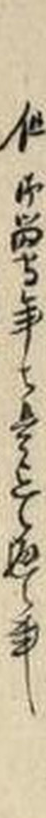御留年は是迄之通候事
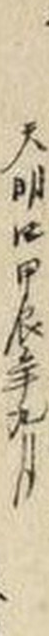天明四甲辰年九月
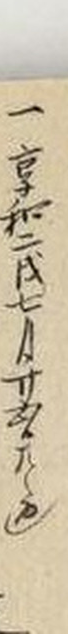一享和二戌七月廿五日左之通
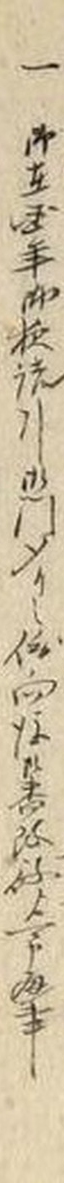一御在国年御夜詰引御門〆り之儀向後御番改役ゟ可申通事
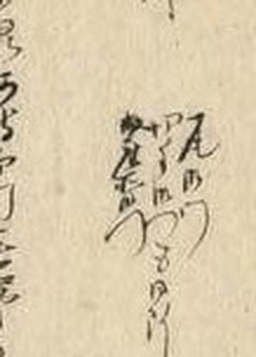御座所御門
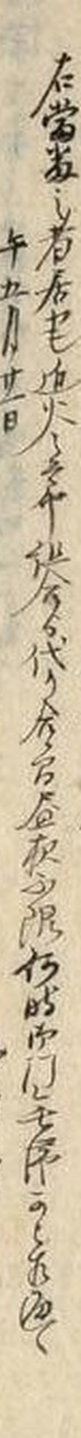右当番之者居宅近火之節組合ゟ代り合候間昼夜不限何時御門無滞可被相通候
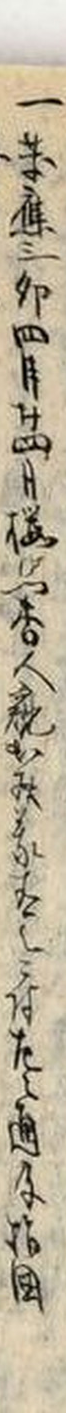一慶応三卯四月廿四日桜御門番人窺出候義有之に付左之通及指図

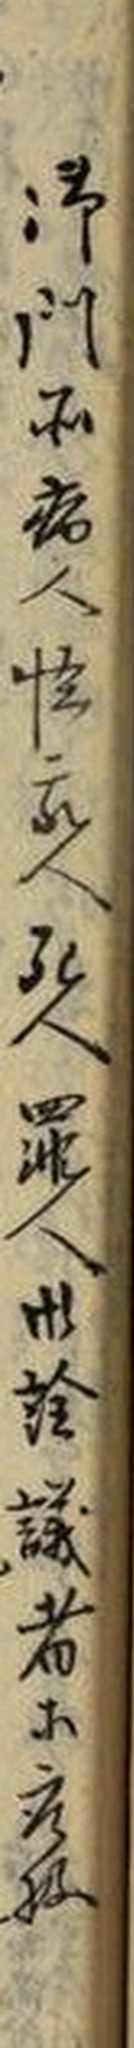御門所病人怪我人死人罪人御詮議者等取扱
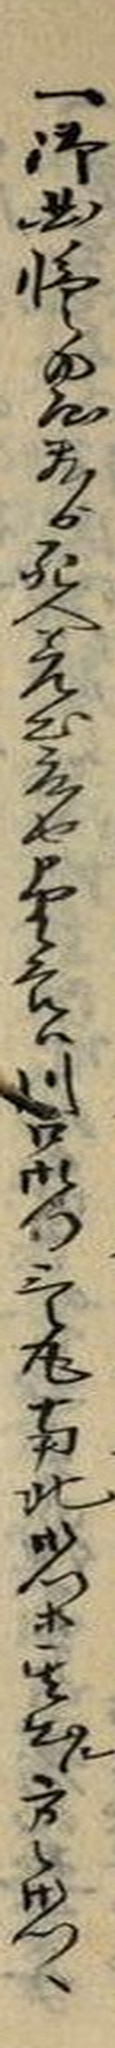一御曲輪之内屋敷ゟ死人差出度由申聞候節は川口御門三之丸南北御門等其出候方之御門へ
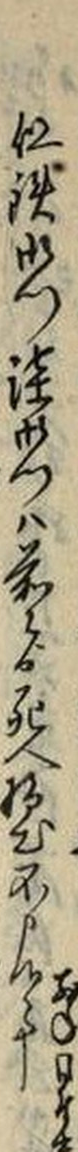但鉄御門漆御門は前々ゟ死人指出不申候事
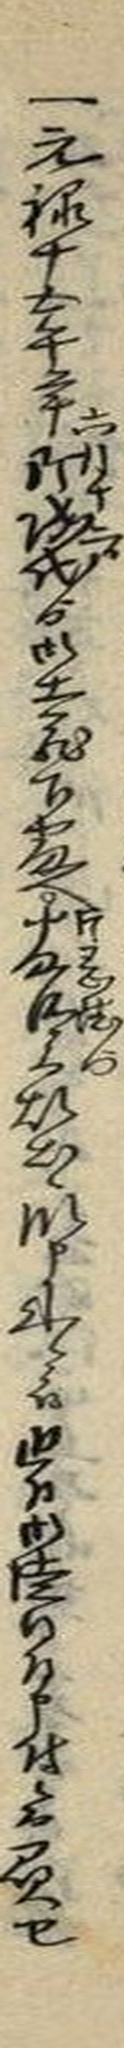一元禄十五午年六月十二日御城代ゟ御土蔵下番人片岡徳右衛門番所に而煩出候段申来候に付追而御徒目付申付候而負せ
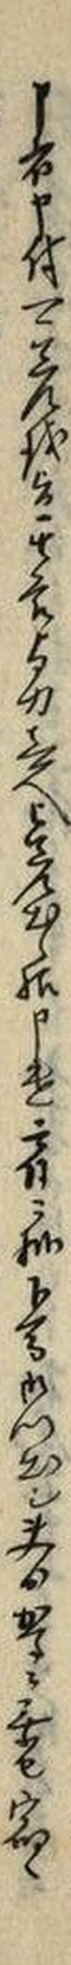申者申付可差越候旨其節与力壱人被差出候様申遣雇ニ掛下馬御門出し夫ゟ駕に乗せ宿へ
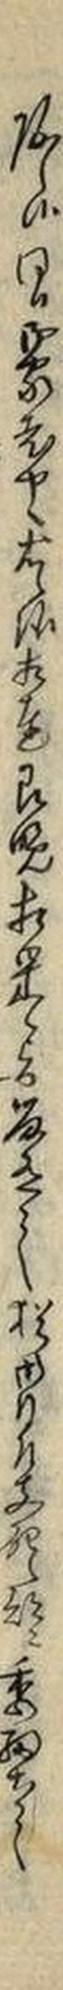帰候同日御家老中へ右趣相達即晩相果候旨留有之猶御目付支配之部に委細出之
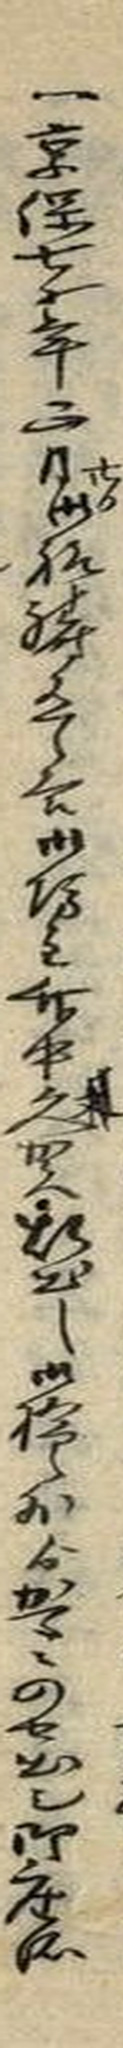一享保七寅年二月廿日祈祷有之節御坊主竹中久賀煩出し御橋之外ゟ駕にのせ出し御座所
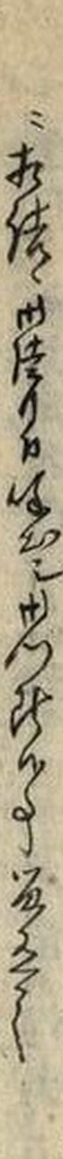に相詰候御徒目付呼出し御門断候事留有之
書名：御門御櫓之部
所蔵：福井県文書館 Fukui Prefectural Archives
